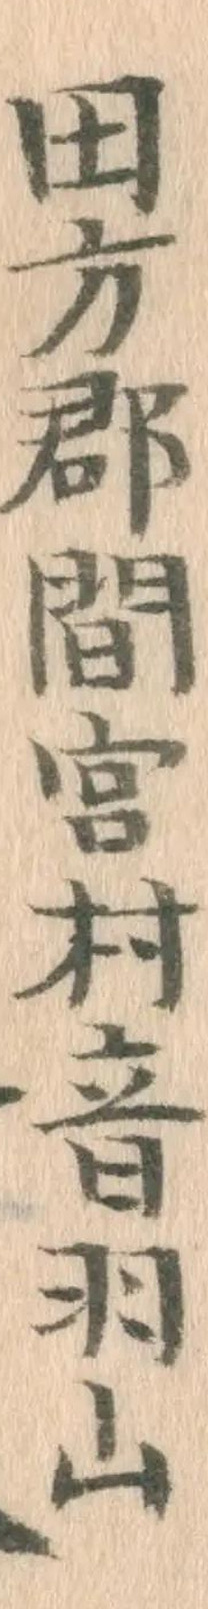田方郡間宮村音羽山

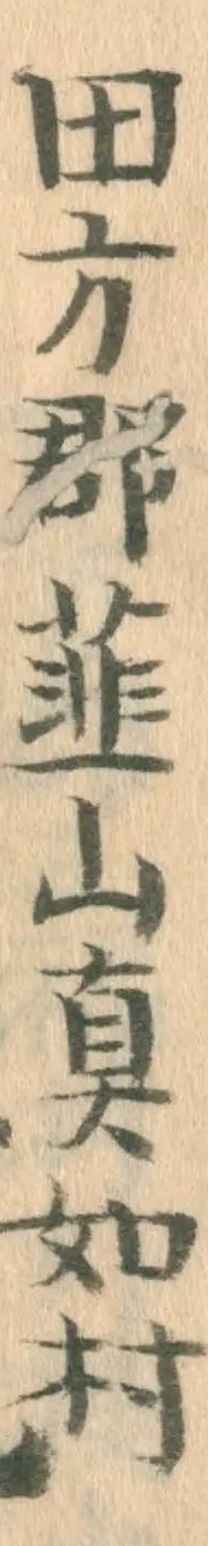田方郡韮山真如村
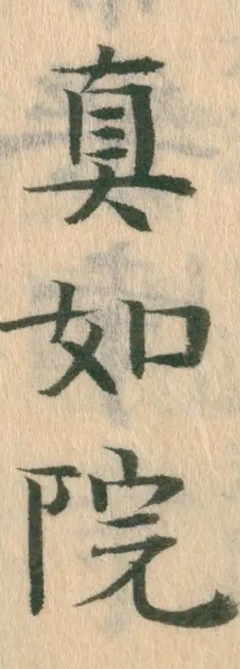真如院
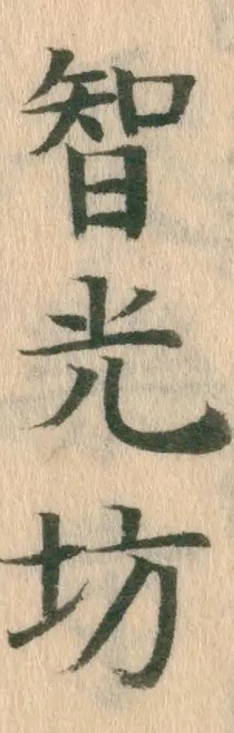智光坊
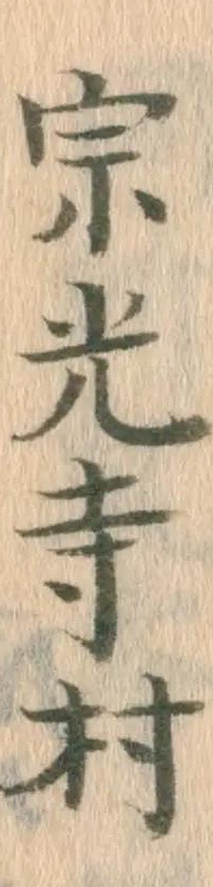宗光寺村
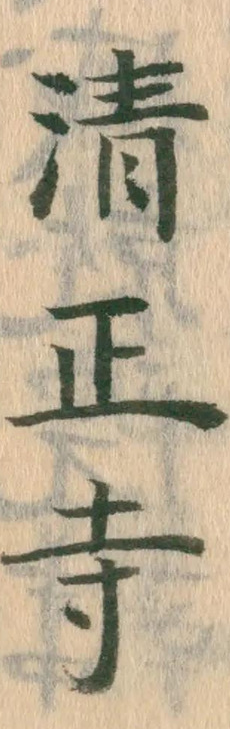清正寺
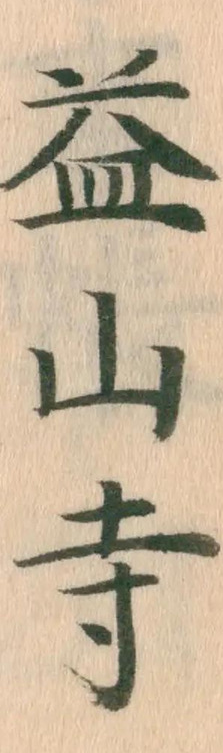益山寺
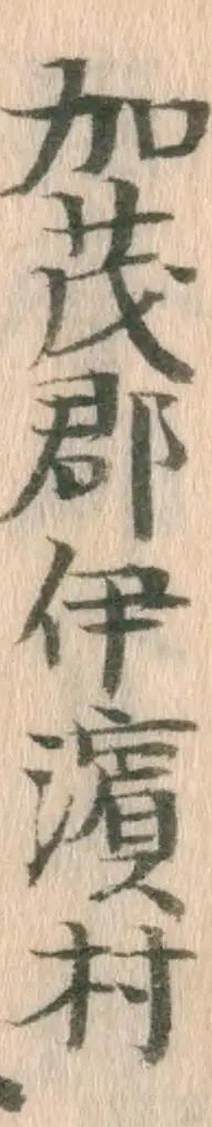賀茂郡伊浜村
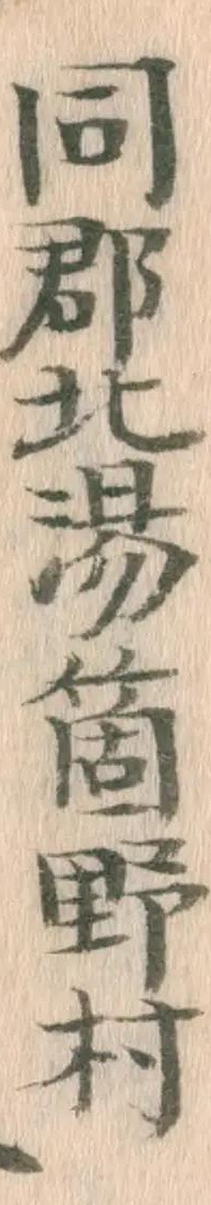同郡北湯箇野村

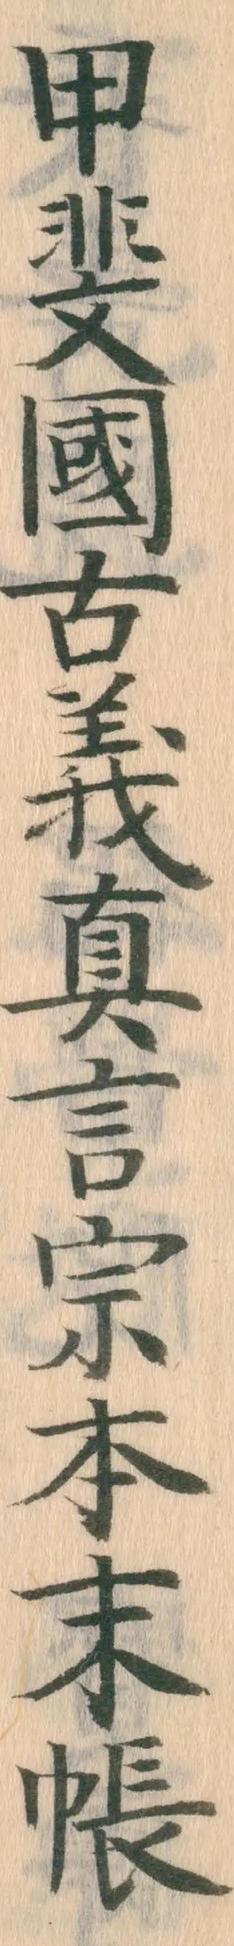甲斐国古義真言宗本未帳
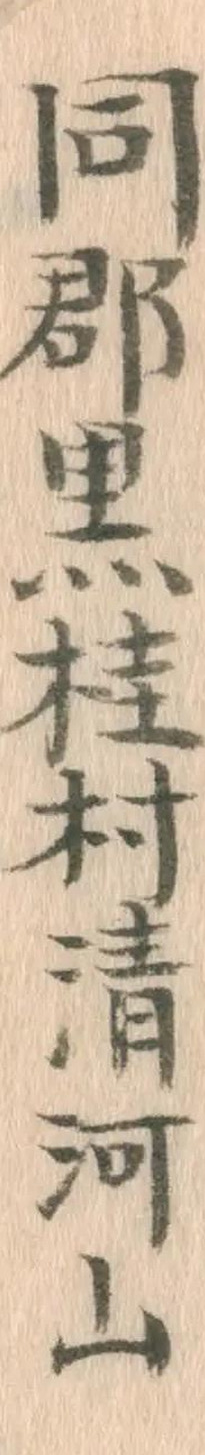同郡黒桂村清河山
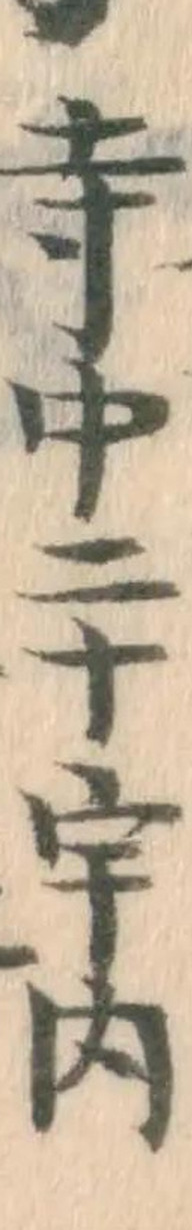寺中二十宇内
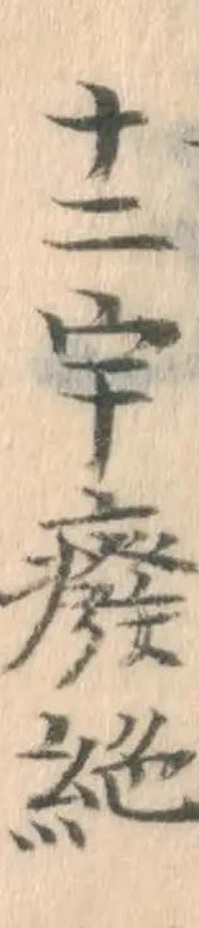十二宇廃絶

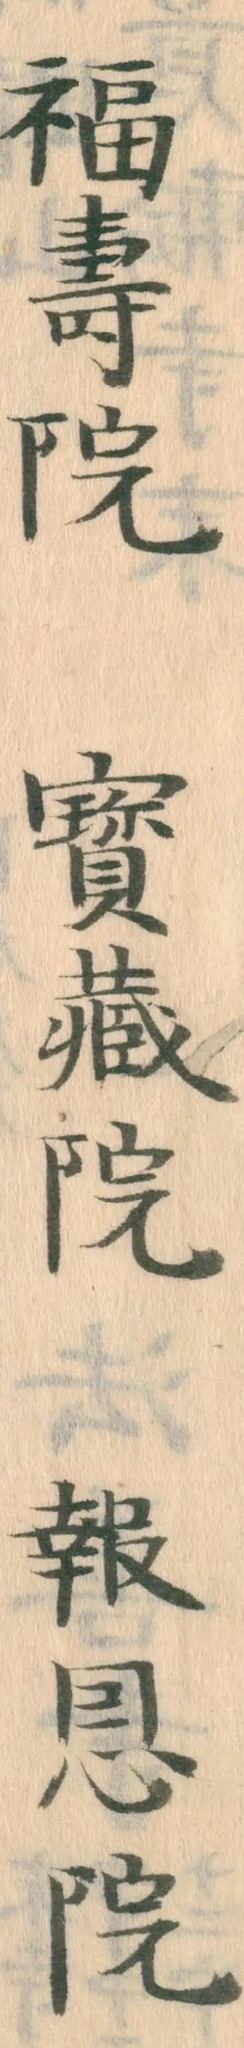福寿院宝蔵院報恩院
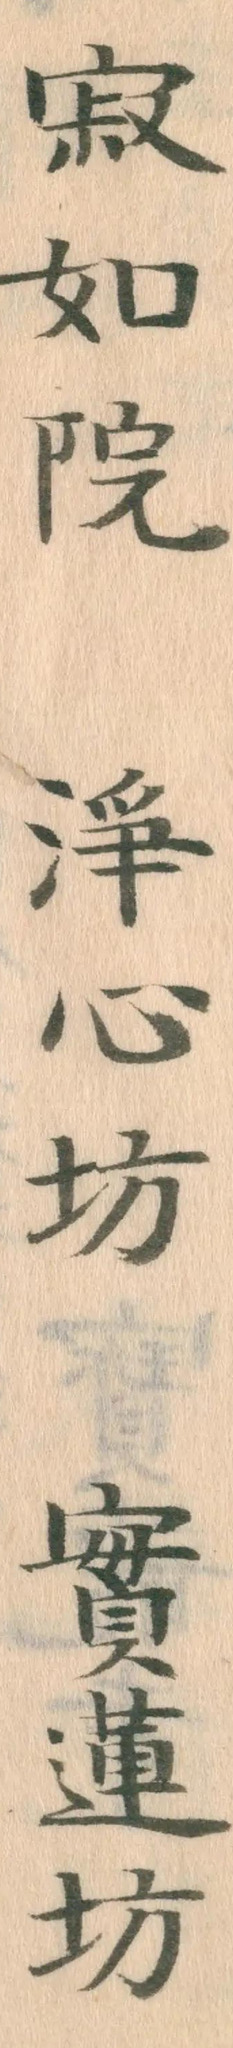寂如院浄心坊実蓮坊
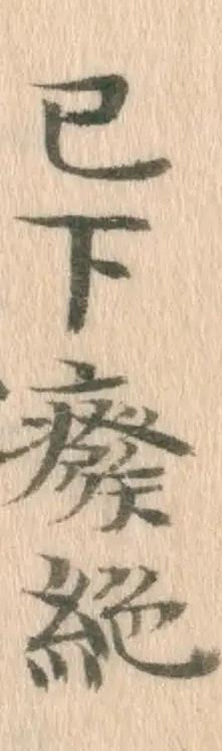已下廃絶
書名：古義真言宗本末帳 21巻. [4] 第三 伊賀国、伊勢国、志摩国、尾張国、三河国、遠江国、駿河国、伊豆国、甲斐国
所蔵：国立国会図書館 National Diet Library, JAPAN
